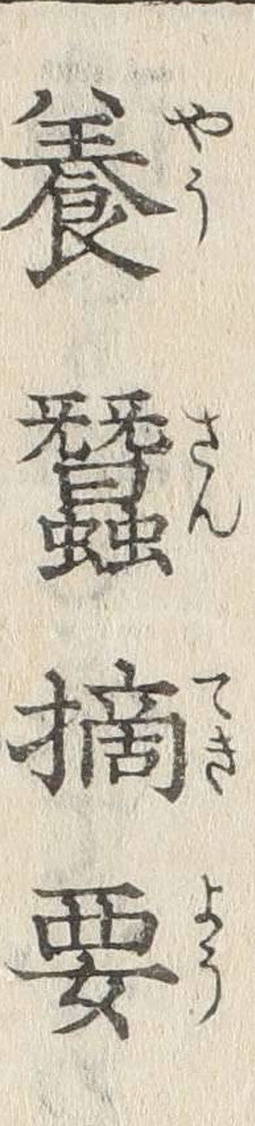養蚕摘要
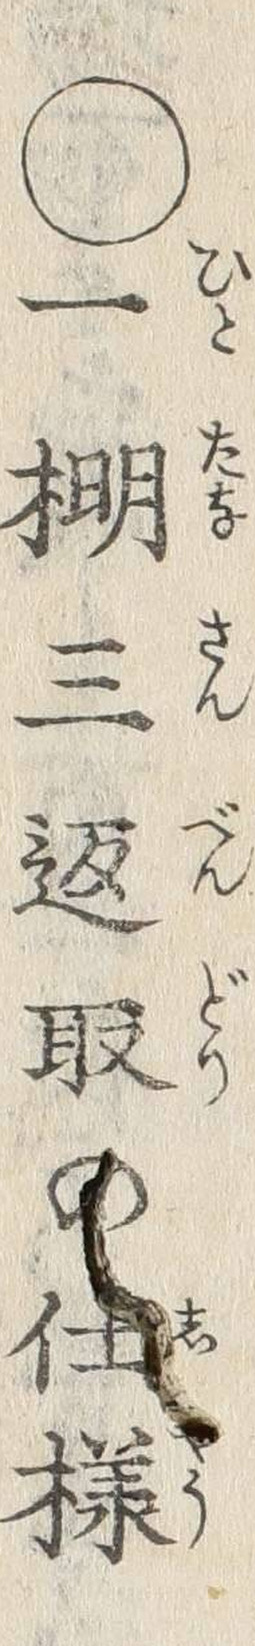○一棚三返取の仕様
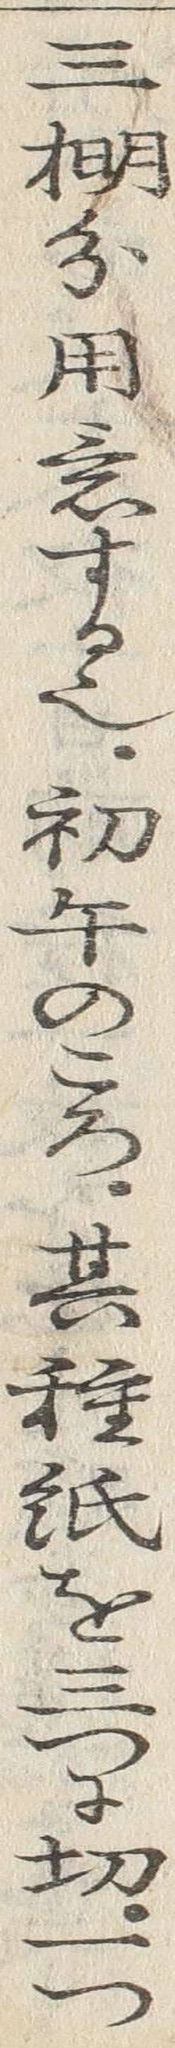三棚分用意する也．初午のころ．其種紙を三つに切．一つ
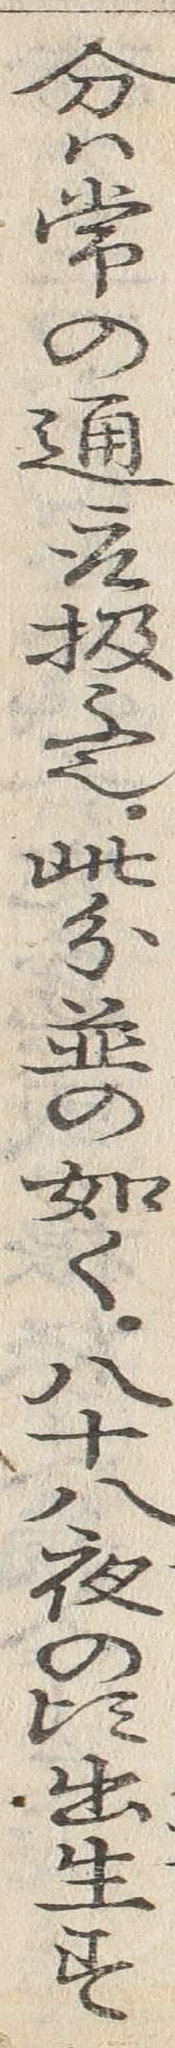分は常の通取扱ふ也．此分並の如く．八十八夜の頃出生す

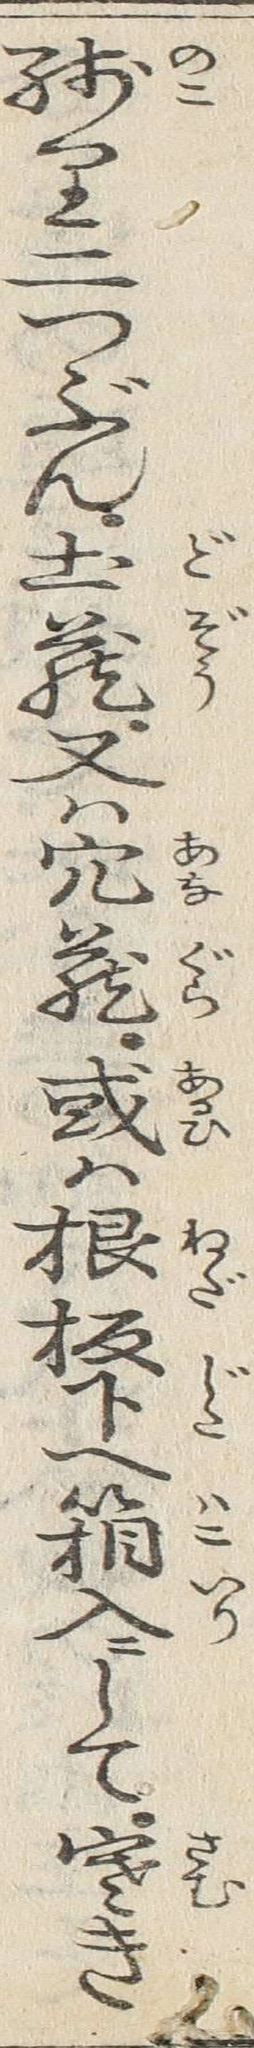残り二つぶん．土蔵．又は穴蔵．或は根板下へ箱入にして．寒き
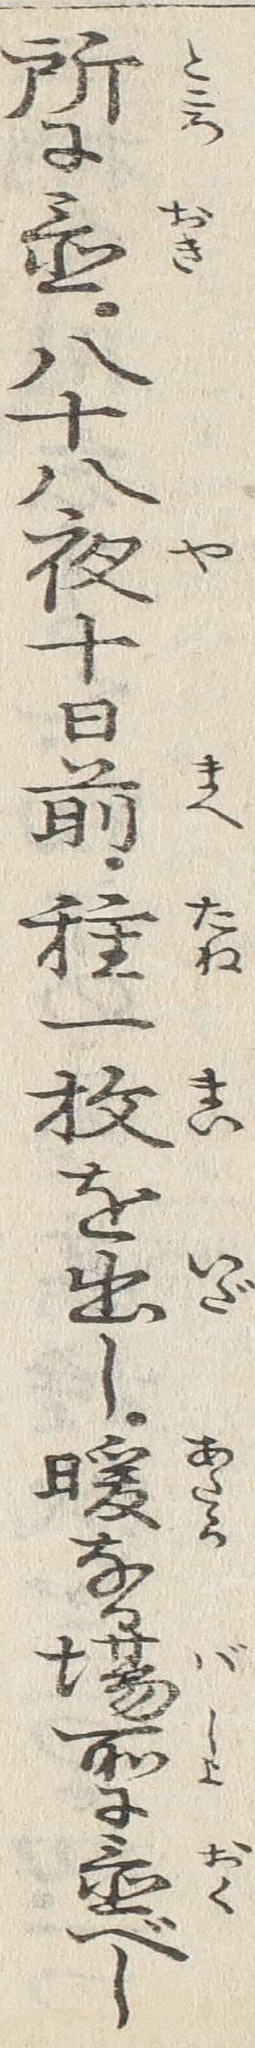所に置．八十八夜十日前．種一枚を出し．暖なる場所に置べし
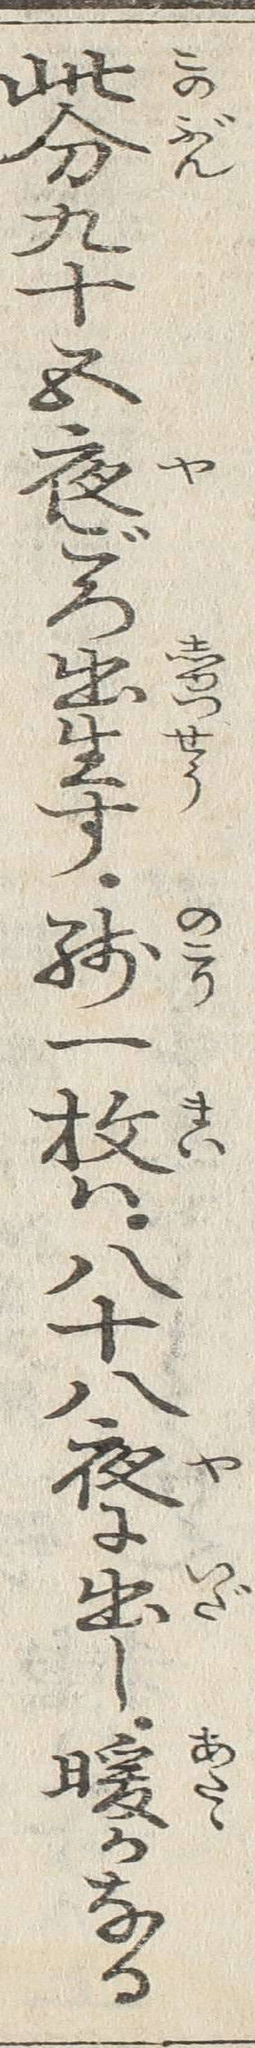此分九十五夜ごろ出生す．残一枚は．八十八夜に出し．暖かなる
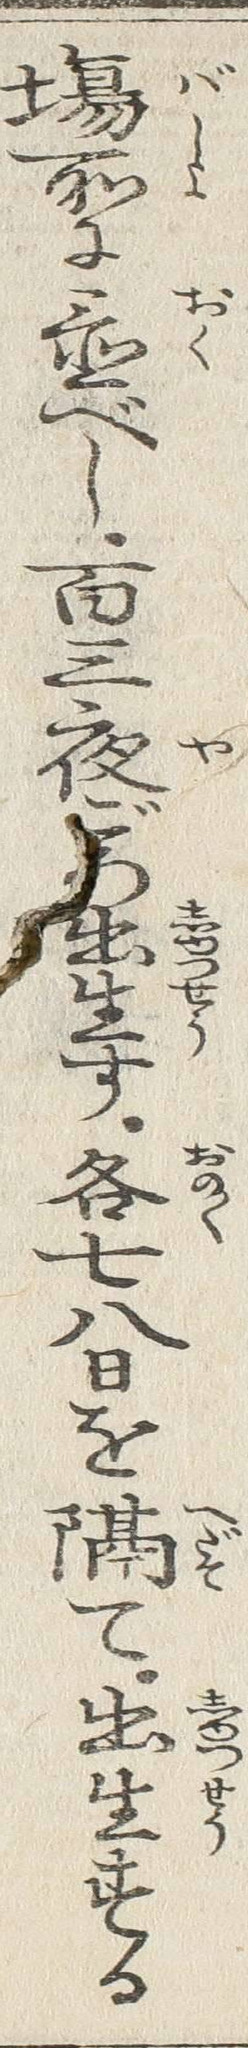場所に置べし．百三夜ごろ出生す．各七八日を隔て．出生する
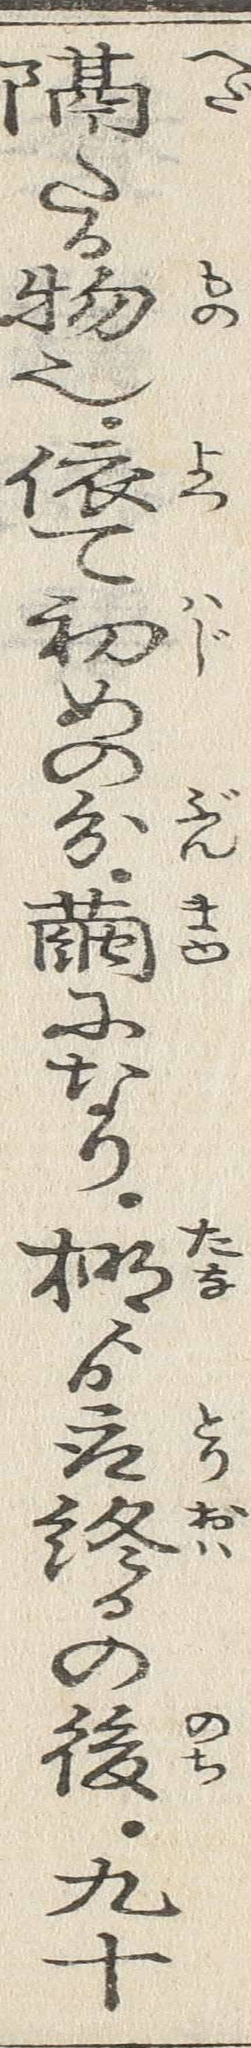隔たる物也．依て初めの分．繭になり．棚ゟ取終るの後．九十
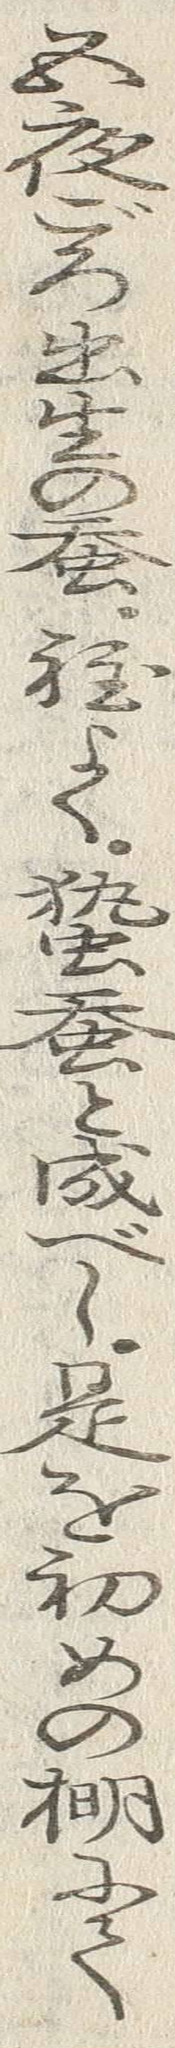五夜ごろ出生の蚕．程よく．蟄蚕と成べし．是を初めの棚にて
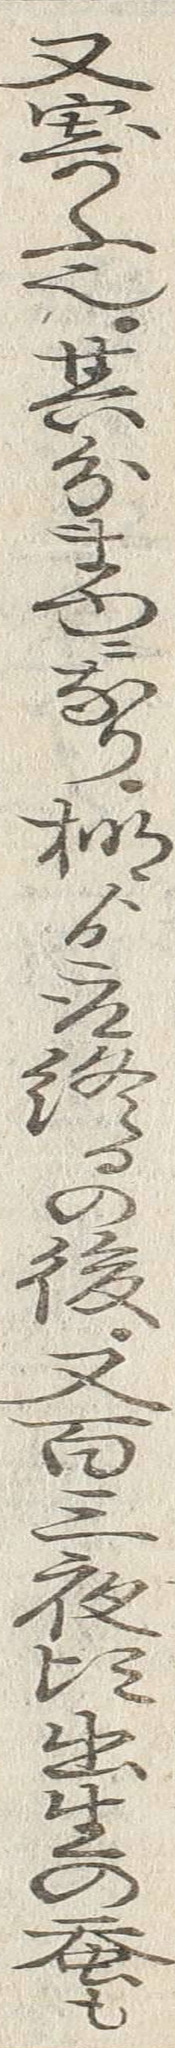又寄ふ也．其分まゆになり．棚ゟ取終るの後．又百三夜頃出生の蚕も
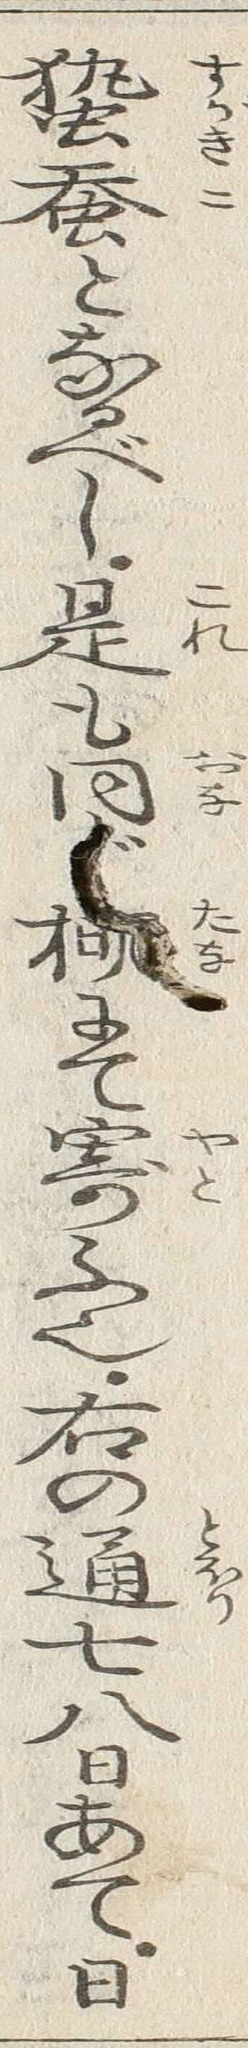蟄蚕となるべし．是も同じ棚にて寄ふ也．右の通七八日あて．日
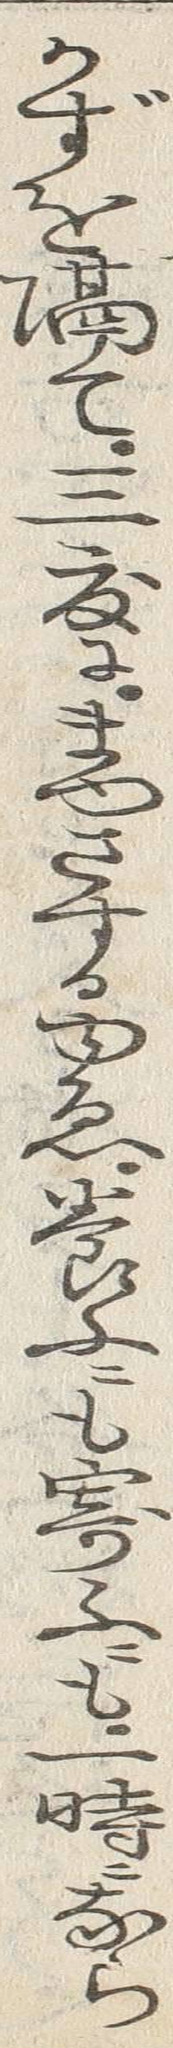かずを隔て．三度に．まゆさするゆゑ．養ふにも寄ふにも．一時になら
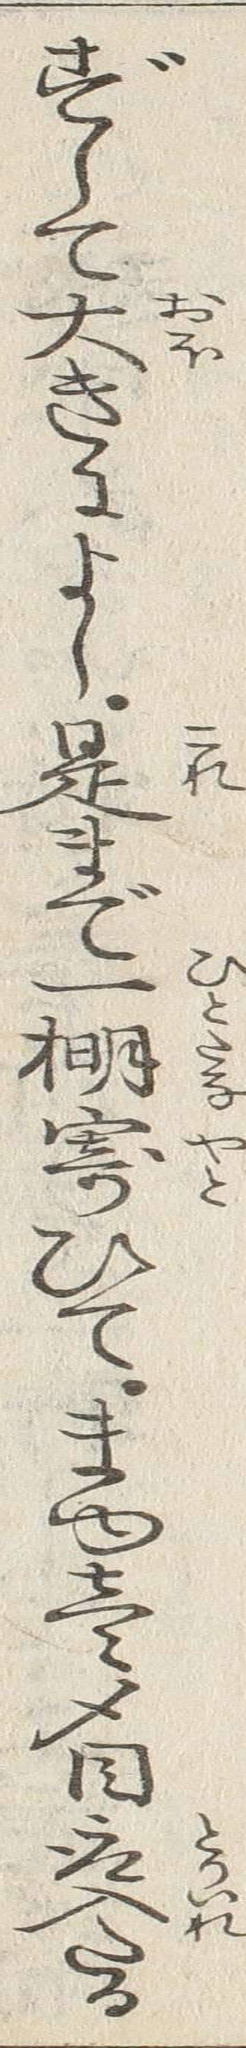ずして大きによし．是まで一棚寄ひて．まゆ壱乄目取入たる
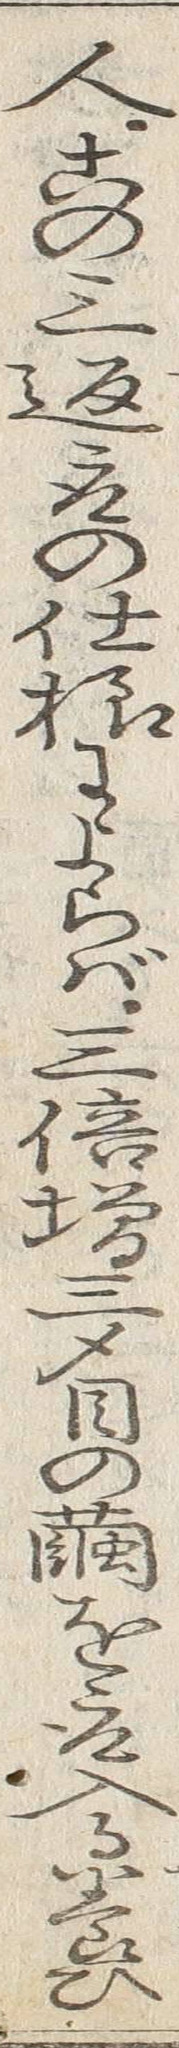人．この三返取の仕様によらば．三倍増三乄目の繭を取入る養ひ
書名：養蠶摘要
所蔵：東京大学農学生命科学図書館 国文学研究資料館
